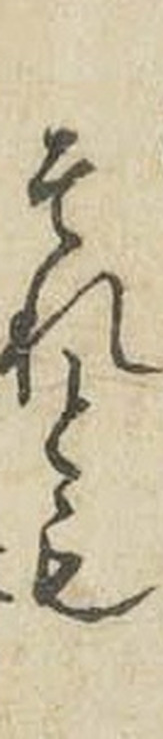それとも
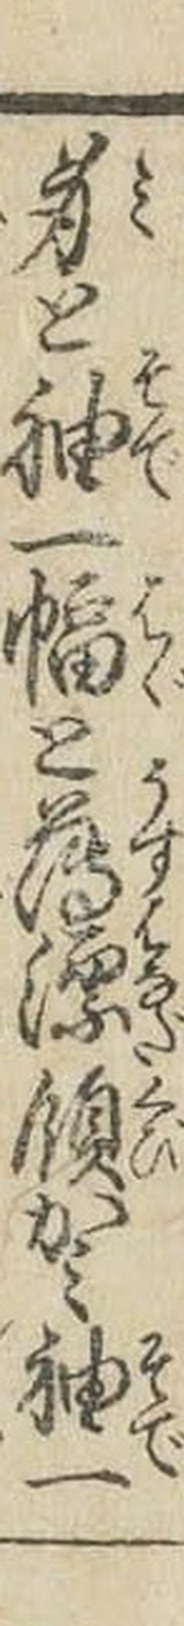身と袖一幅と薄縹領かみ袖一
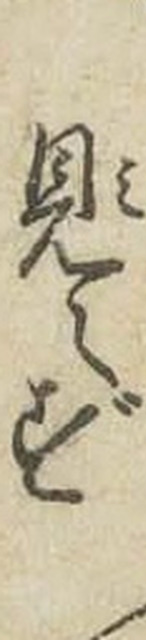見えず
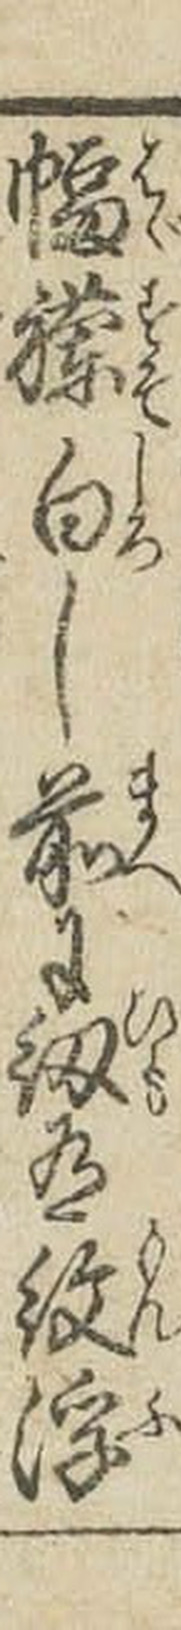幅裙白し前に紐有紋浮
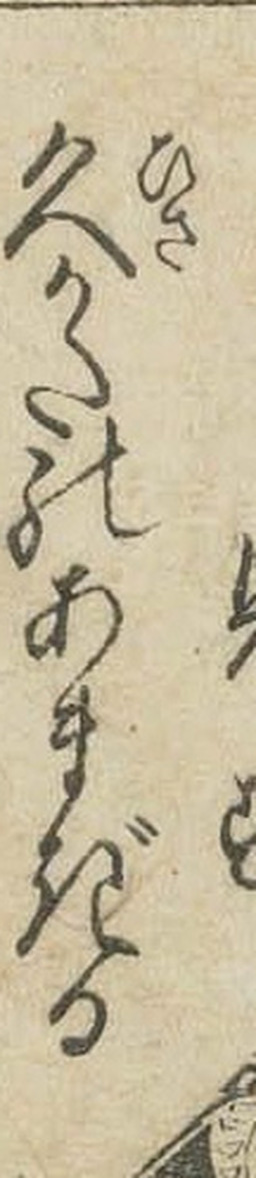久かたのあまぎる
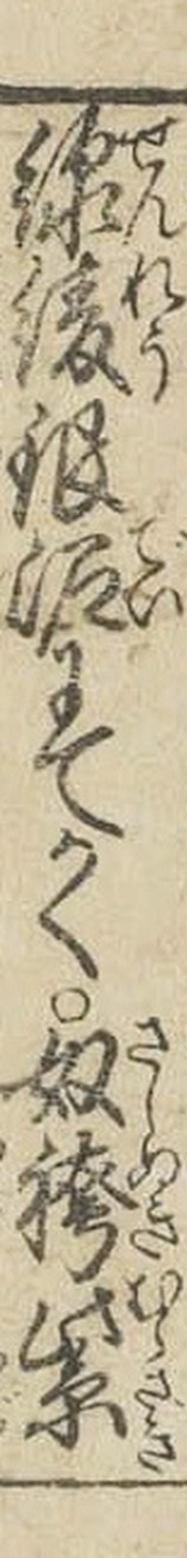線綾銀泥にてかく○奴袴紫
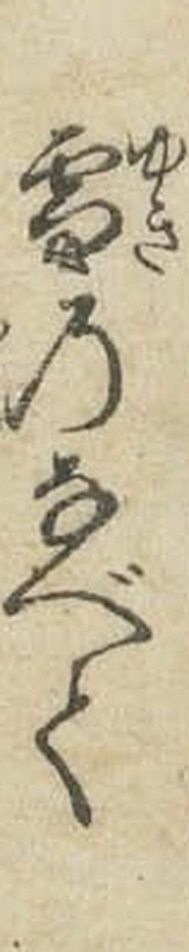雪のなべて
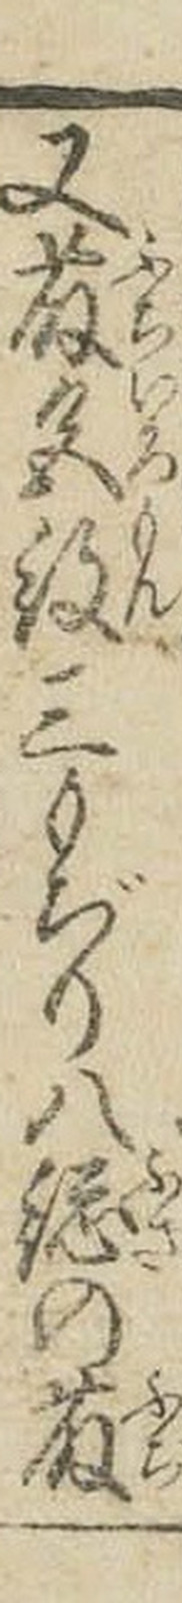又藤色紋三もぢり八総の藤
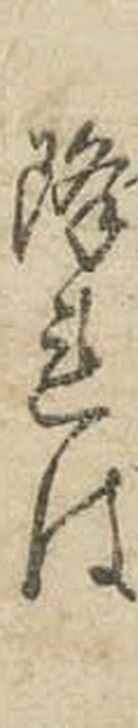降れば
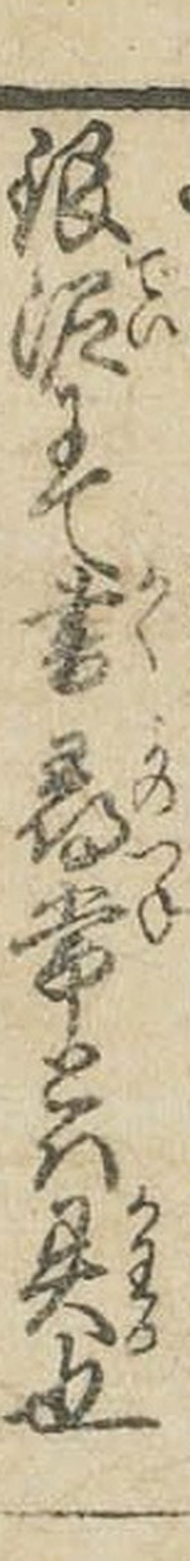銀泥にて書尋常とは異也
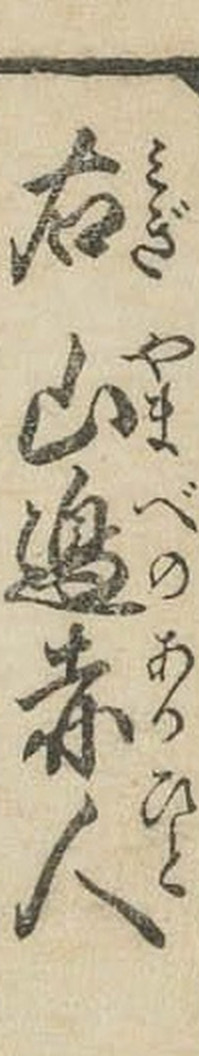右山辺赤人
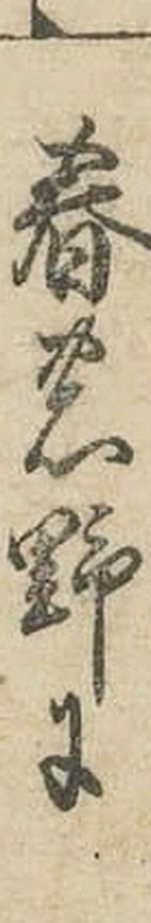春の野に
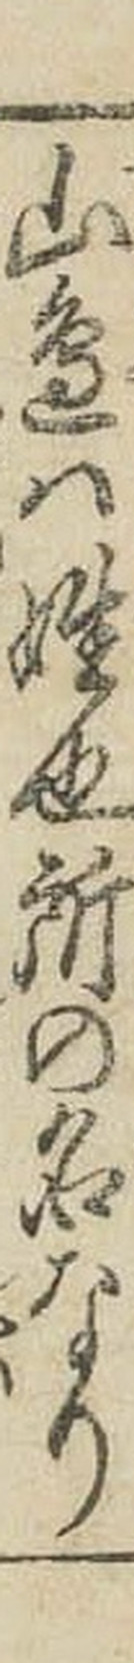山辺は姓也所の名なり
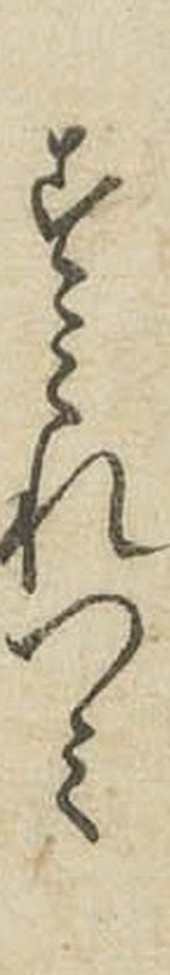すみれつみ
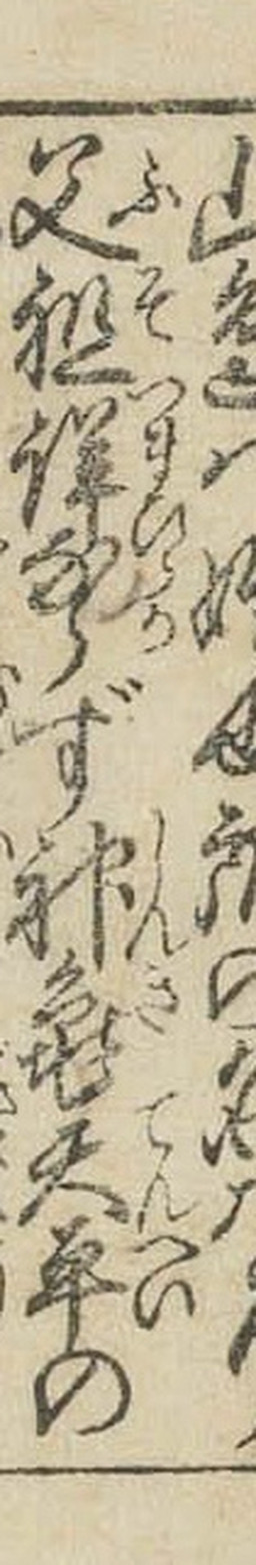父祖詳ならず神亀天平の
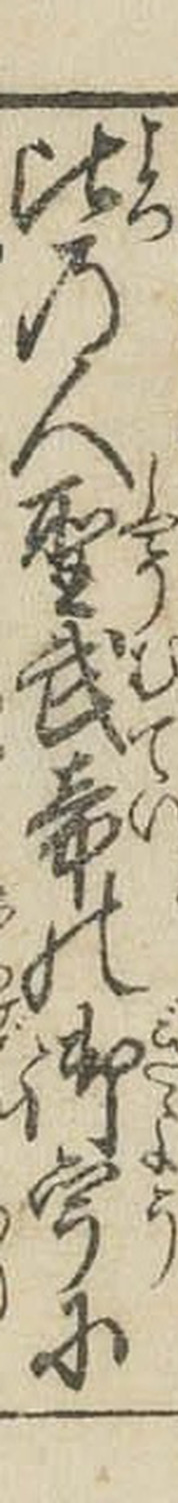比の人聖武帝の御宇に
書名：絵本写宝袋 9巻 1之巻
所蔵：東京学芸大学教育コンテンツアーカイブ
